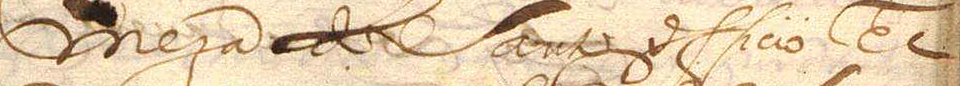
mesa do Santo officio he
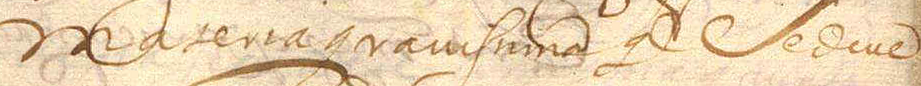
materia grauissima q̄ Se deue
